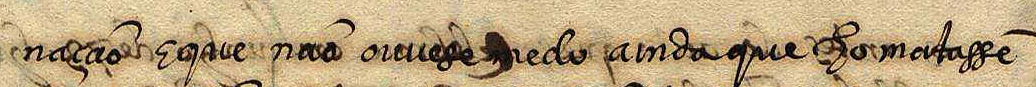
nacaõ E que naõ ouuese medo ainda que lho matassē
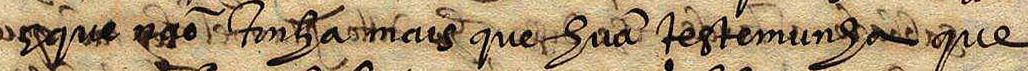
E que naõ tinha mais que huā testemunha que
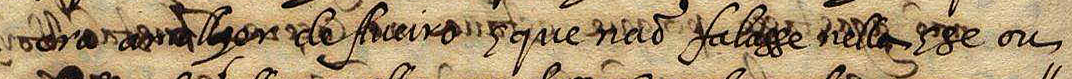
era a molher de Aueiro E que naõ falasse nella E se ou
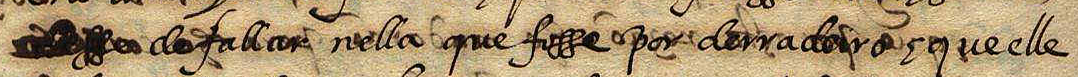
uesse de fallar nella que fosse por derradeiro E que elle
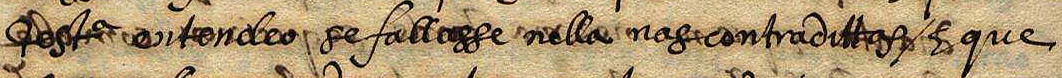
testa entendeo se fallasse nella nas contradittas / E que
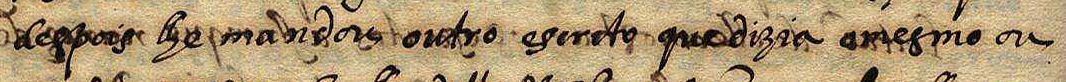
despois lhe mandou outro escrito que dizia o mesmo ou
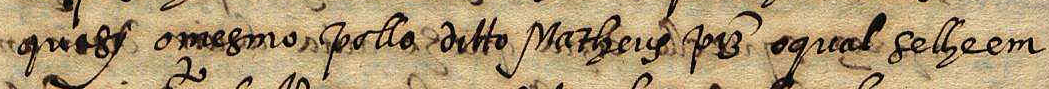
quasy o mesmo pollo ditto Matheus piz̄ o qual se lhe em
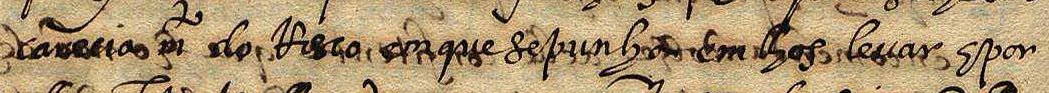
carecia mto do Risco em que se punha em lhos leuar E por
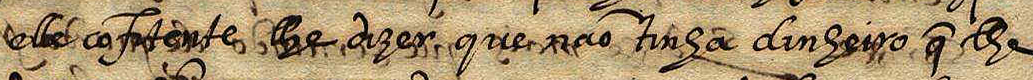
elle cōfitente lhe dizer que naõ tinha dinheiro q̄ lhe
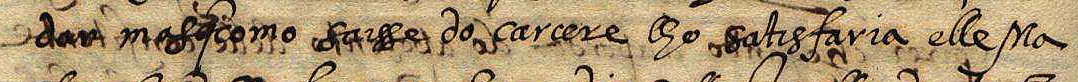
dar mas q̄ como saisse do carcere lhe satisfaria elle Ma
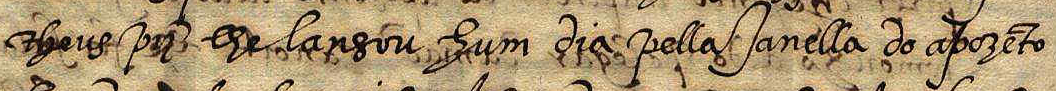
theus piz̄ lhe lansou hum dia pella / Janella do apozēto
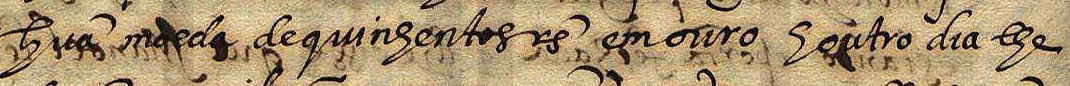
huā moeda de quinhentos rs̄ em ouro E outro dia lhe
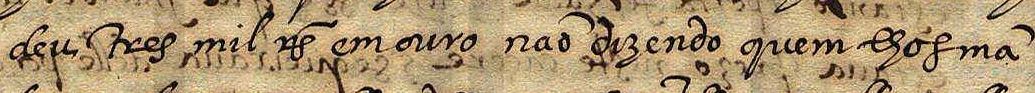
deu tres mil rs̄ em ouro naõ dizendo quem lhos mā
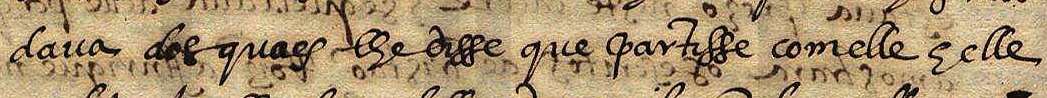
daua dos quaes lhe disse que partisse com elle E elle
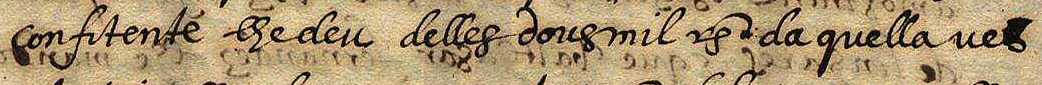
confitente lhe deu delles dous mil rs̄ daquella ues
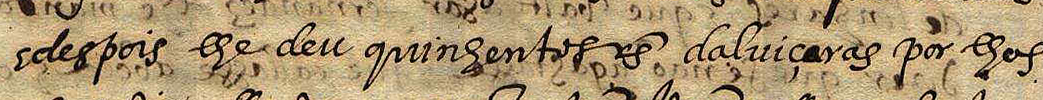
E despois lhe deu quinhentos rs̄ daluiçaras por lhas
